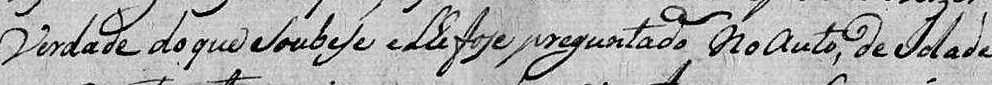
Verdade do que soubese e lhe fose preguntado no auto, de Idade
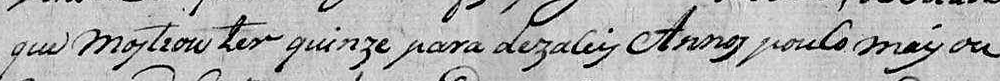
que mostrou ter quinze para dezaCeis Annos pouCo mais ou
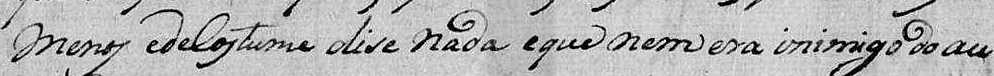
menos e de Costume dise nada e que nem era inimigo do au
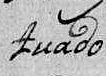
tuado.
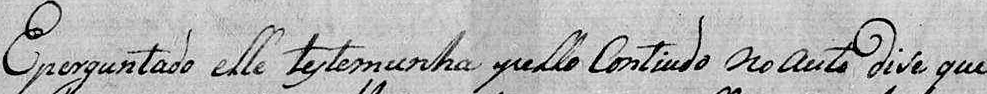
E perguntado elle testemunha pello Contiudo no auto dise que
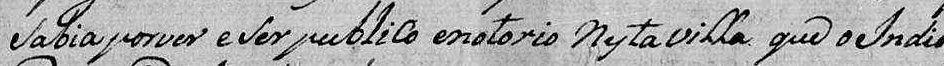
sabia por ver e ser publico e notorio nesta villa que o Indio
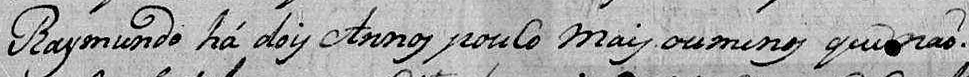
Raymundo há dois Annos pouCo mais ou menos que naõ.
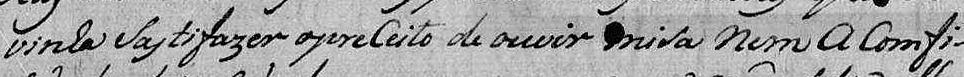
vinha sastifazer o preCeito de ouvir misa nem A Comfi
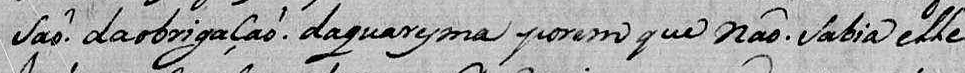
saõ. da obrigaÇaõ. da quaresma porem que naõ. sabia elle
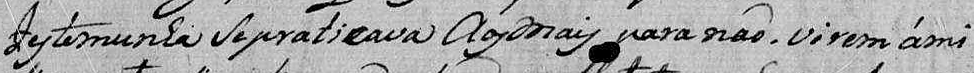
testemunha se praticava Aos mais para naõ. virem á mi
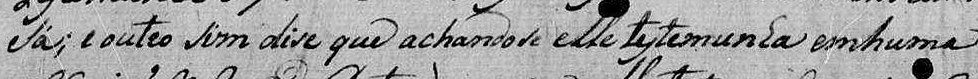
sá; e outrosim dise que achandose elle testemunha em huma
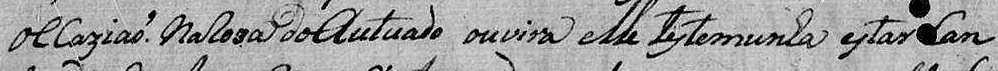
oCCaziaõ. Na Rosa do Autuado ouvira elle testemunha estar Can
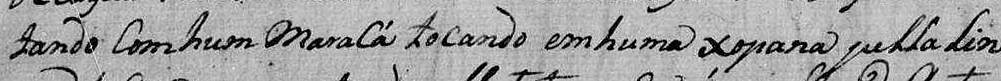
tando Com hum MaraCá tocando em huma xopana pella Lin
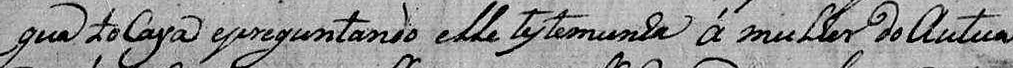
gua toCaya e preguntando elle testemunha á mulher do Autua
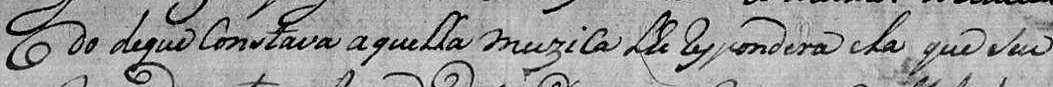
do de que Constava aquella muziCa lhe Respondera ela que seu
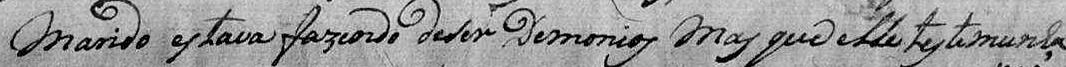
marido estava fazendo de ser Demonios mas que elle testemunha
